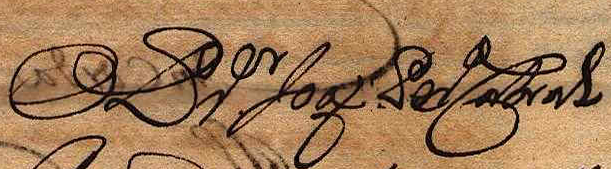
O Pr.or Joaõ Pera CabraL
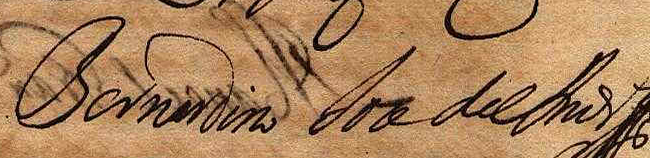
Bernardino Ioze de Andr.e
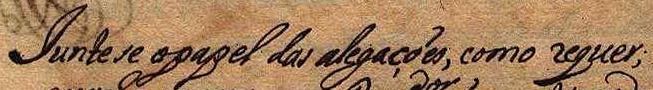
Iunte se o papel das alegações, como requer;
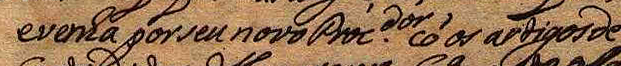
e venha por seu novo Proc.dor cō os artigos de
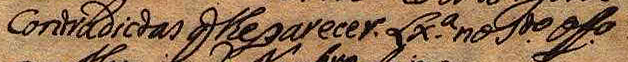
contradictas q̄ lhe parecer. Lx.a no s.to Off.o
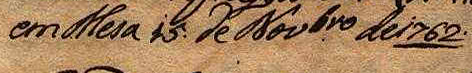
em Mesa i5. de Novbro de i762.
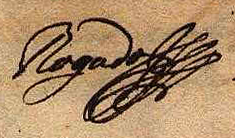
Rogado
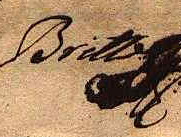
Britto
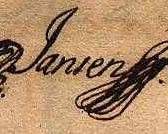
Iansen
